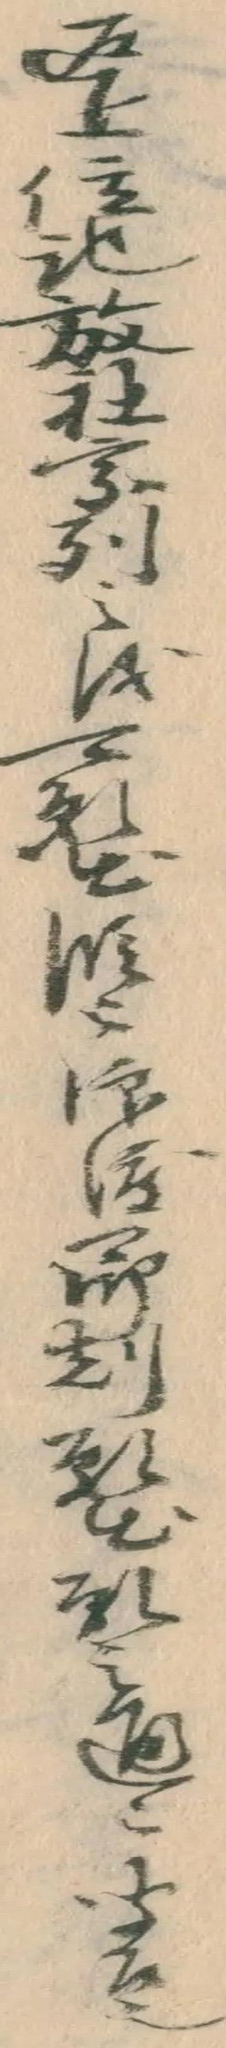返上位記放社家列之趣可願出段被仰渡即刻願出願之通被聞召也
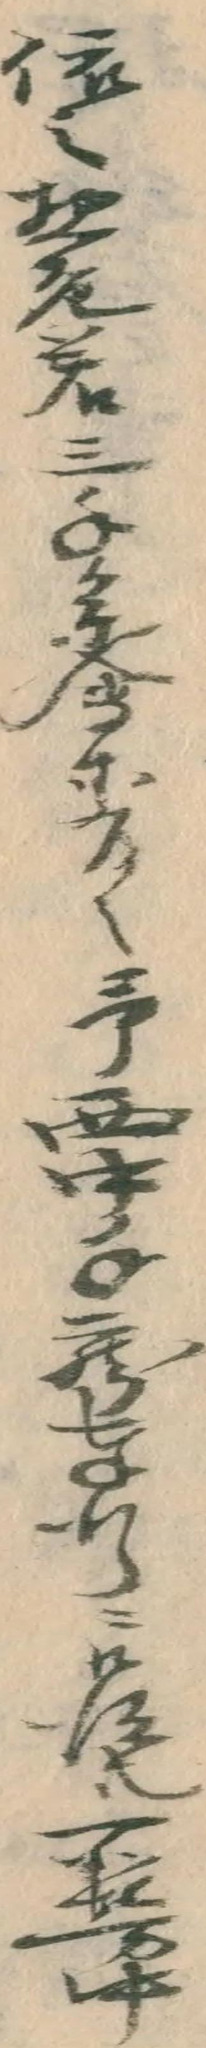依之惣老若三手参會等有之予西中手蔵奉行に候得共所労中
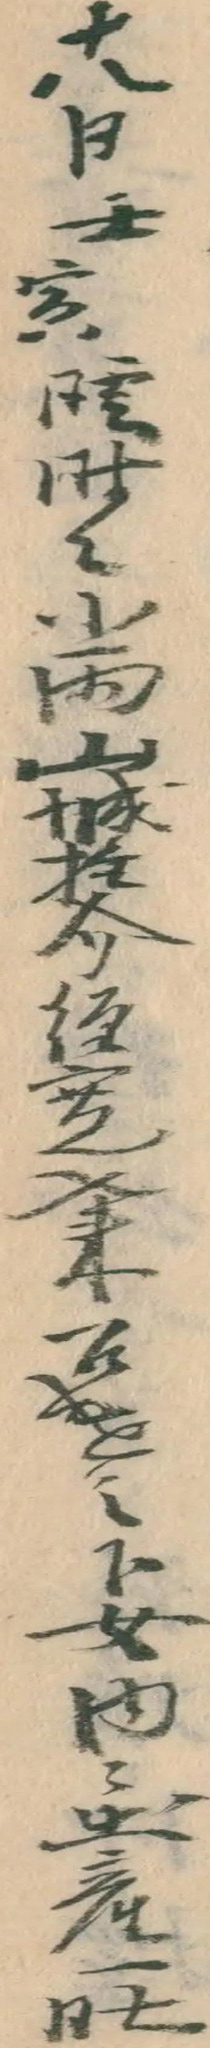十八日壬寅晴時々小雨山城権介経寛入来召遣之下女内々出産一昨

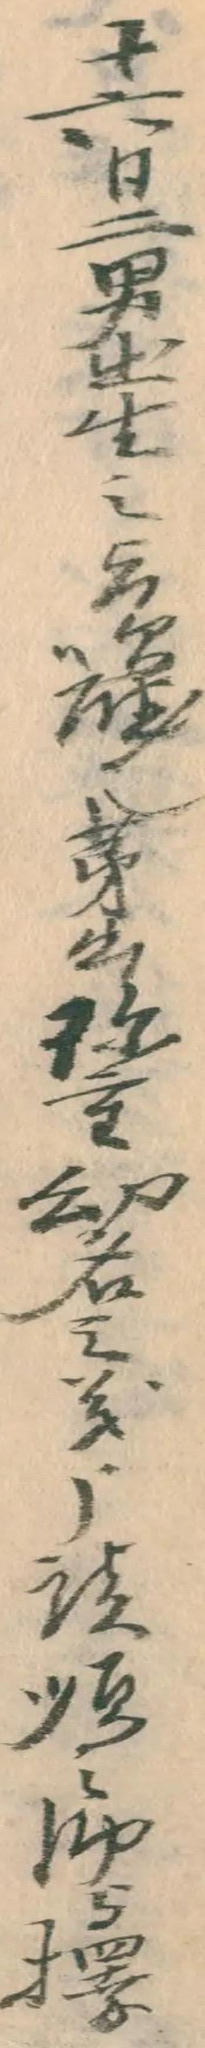十六日二男出生之旨吹聴也芽出弥重幼名之義申談順之助与擇
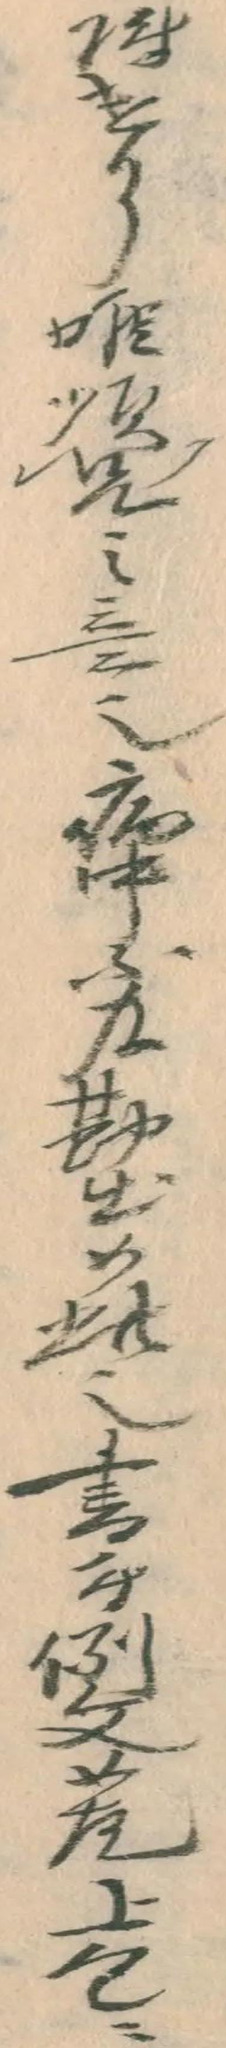附遣了唯順兄之意也病中不及勘出如此也書付例文如左上包ニ
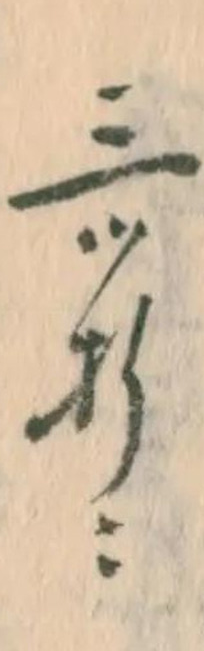三つ折ニ
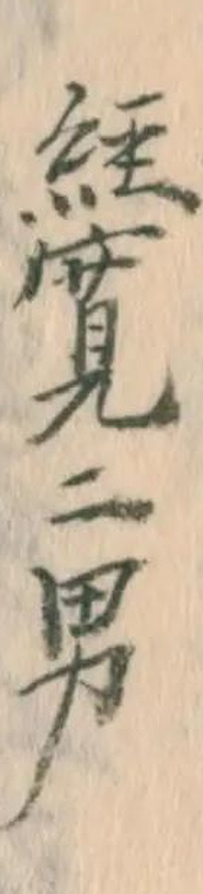経寛二男
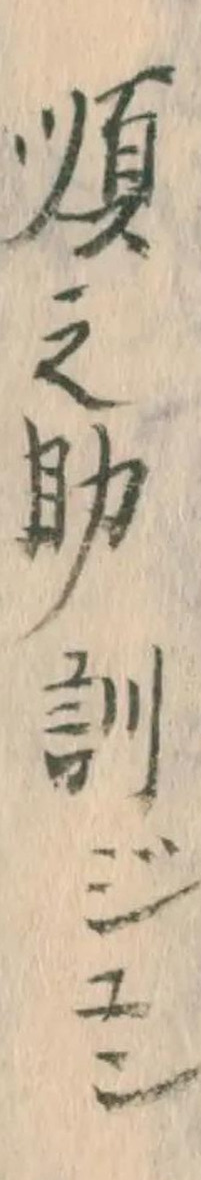順之助訓ジユン
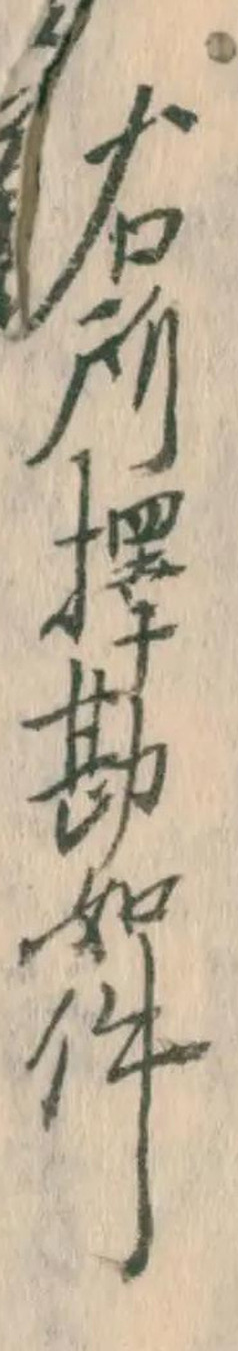右所擇勘如件
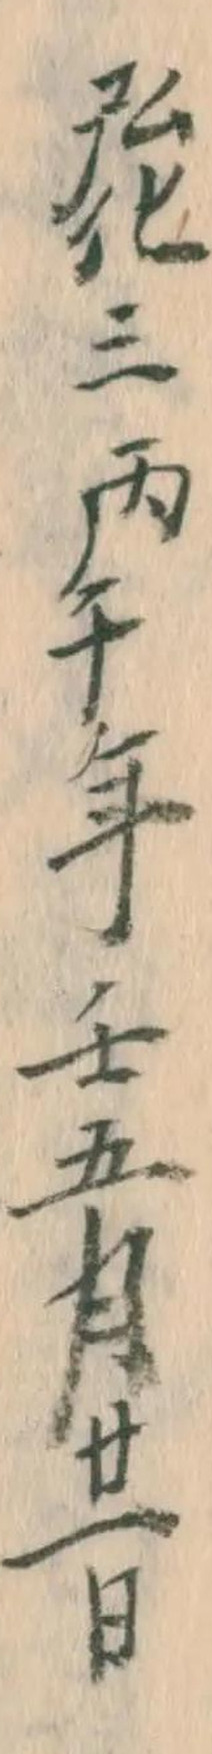弘化丙午年壬五月廿一日
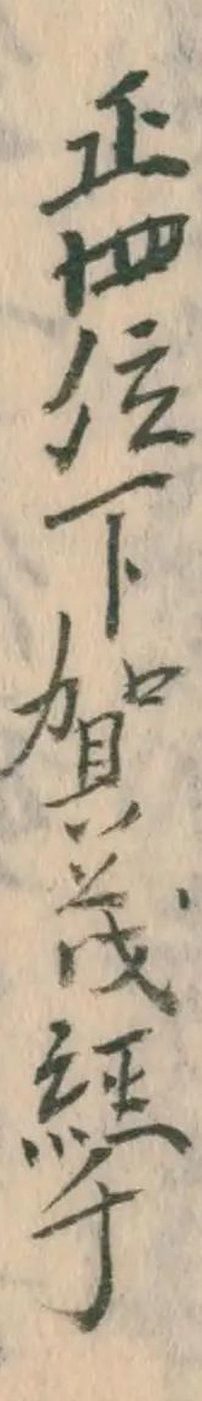正四位下賀茂経千
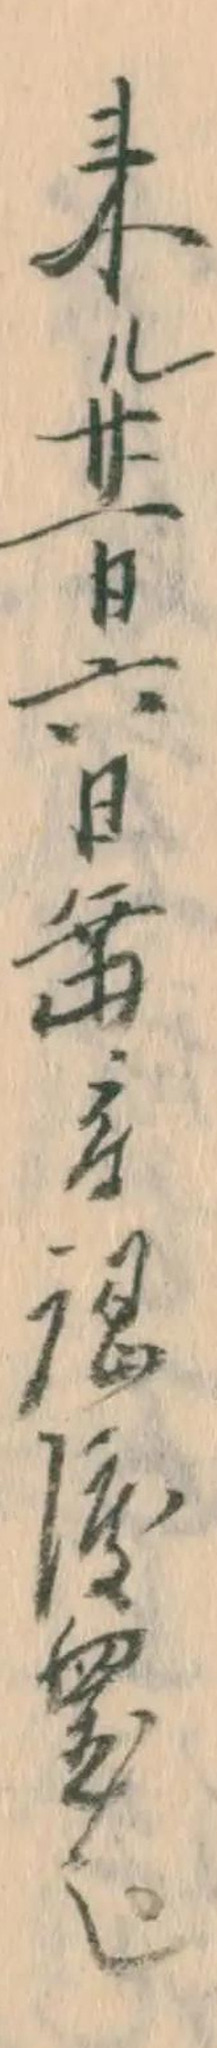来ル廿一日六日歯ニ付認渡置之
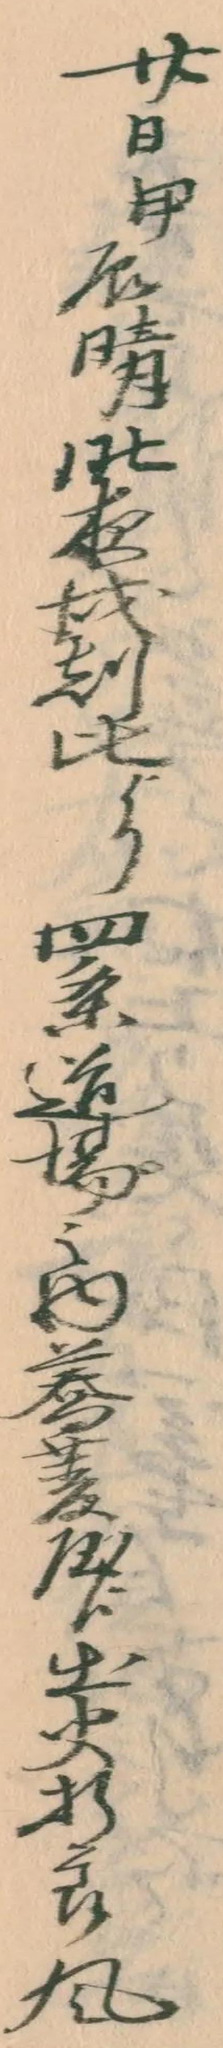廿日甲辰晴昨夜戌刻比より四条道場之内蕎麦屋ゟ出火折節風
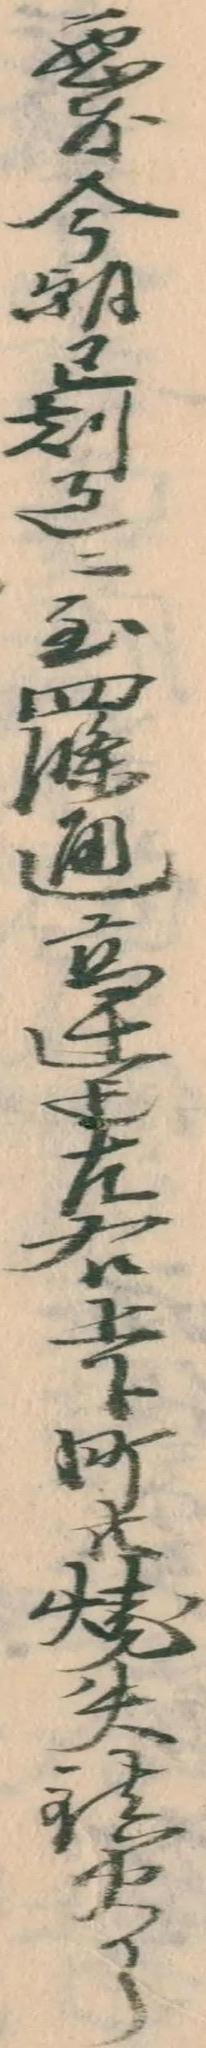悪敷今朝巳刻過ニ至四條通高辻迄左右上下町共焼失鎮火了
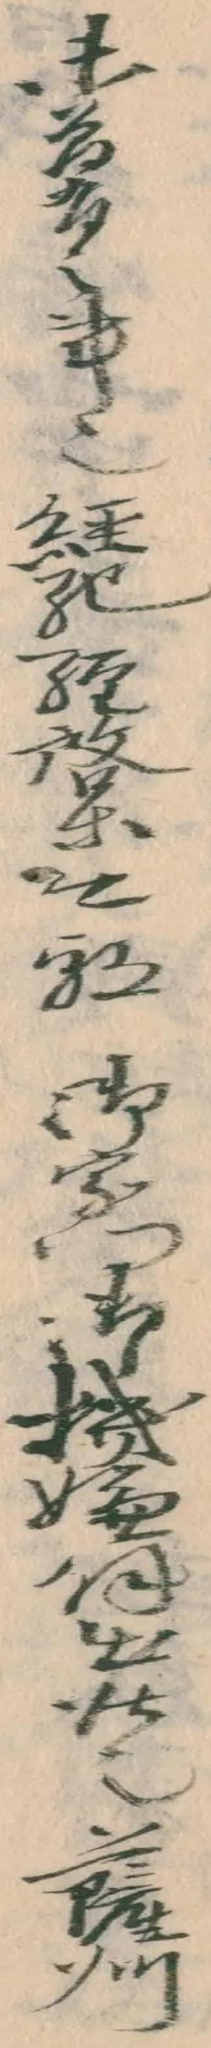未曾有之事也経紀経啓等今朝御家門御機嫌伺出仕也薩州
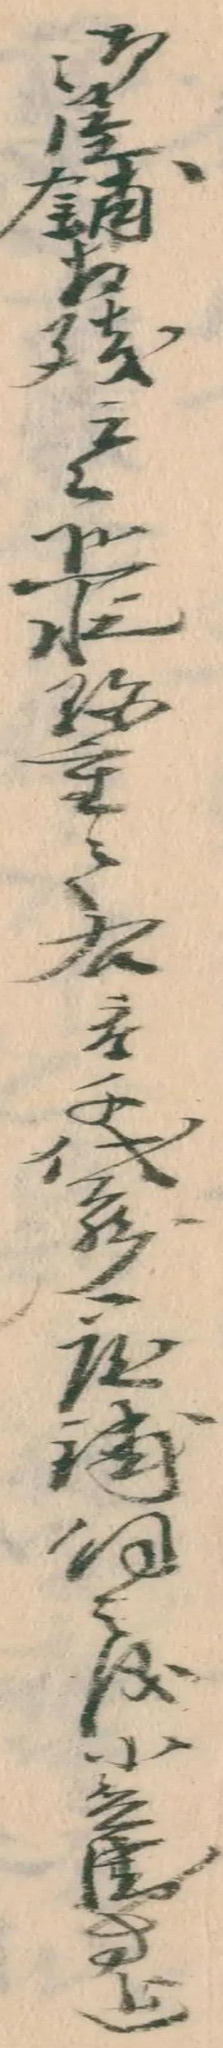御屋鋪相残云々恐悦珍重々々右ニ付千代蔵御屋鋪伺之儀小兵衛方迄
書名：賀茂社記録. 第70冊
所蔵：国立国会図書館 National Diet Library, JAPAN
